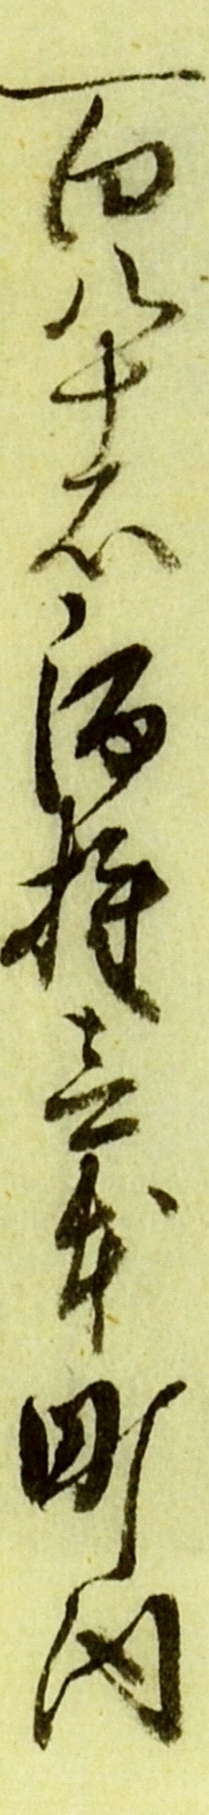百八十石酒株壱本町内
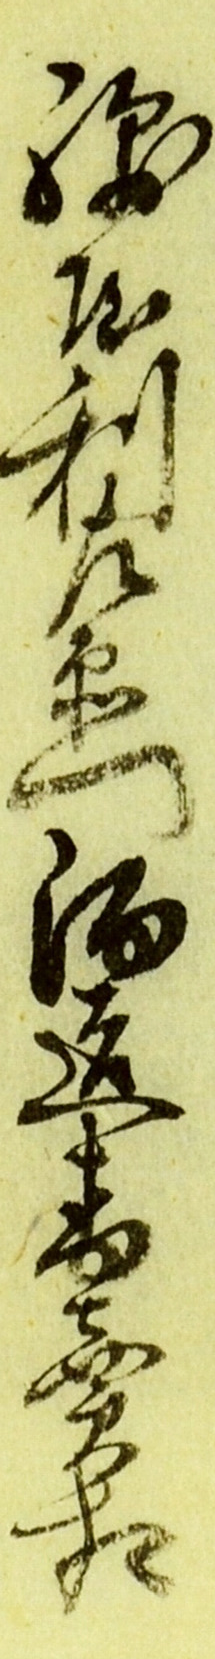綿屋利左衛門酒造商売相
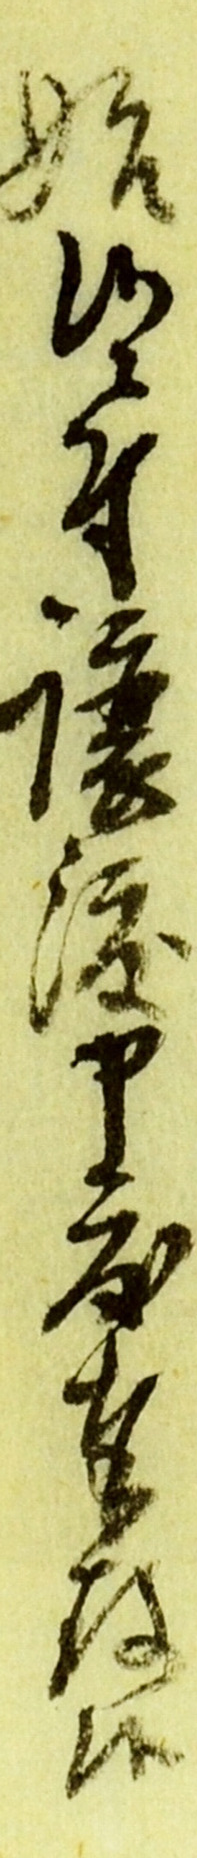始候ニ付譲渡申度奉存候
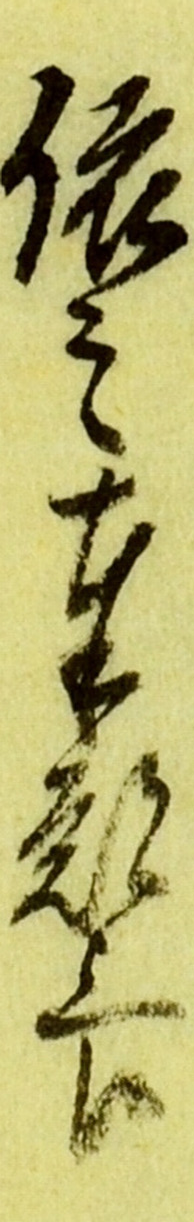依之奉願上候
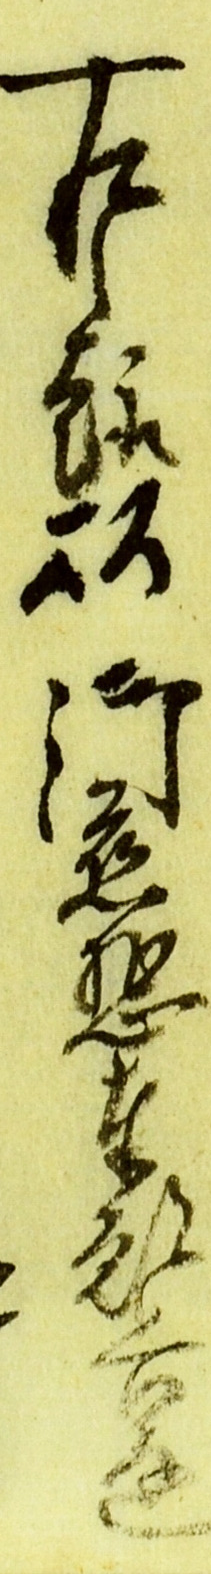右之趣以て御慈悲奉願上候通
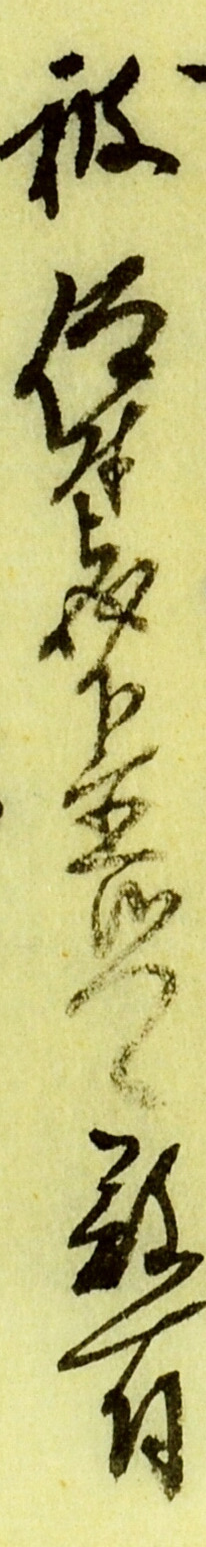被仰付被成下置候ハヽ難有
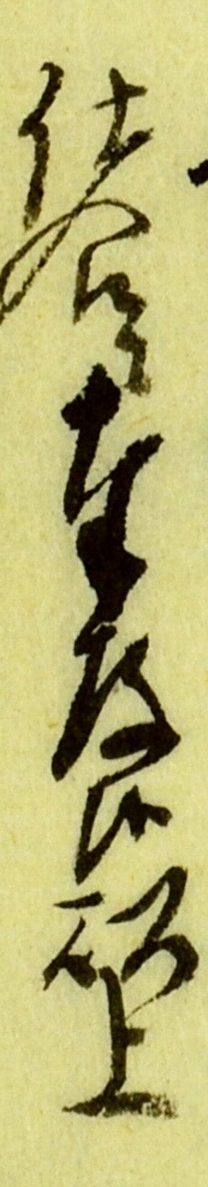仕合ニ奉存候以上
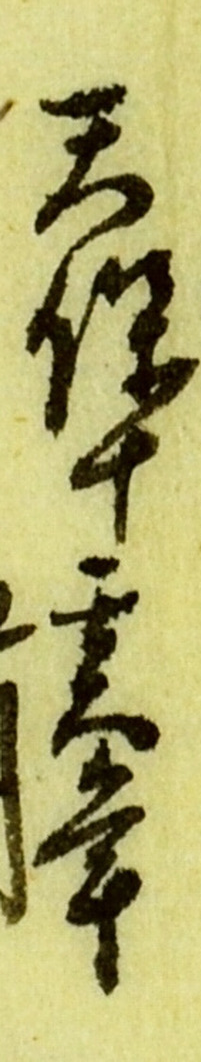天保十亥年
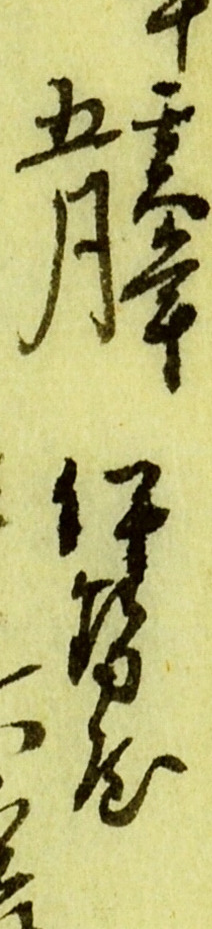五月伊勢屋
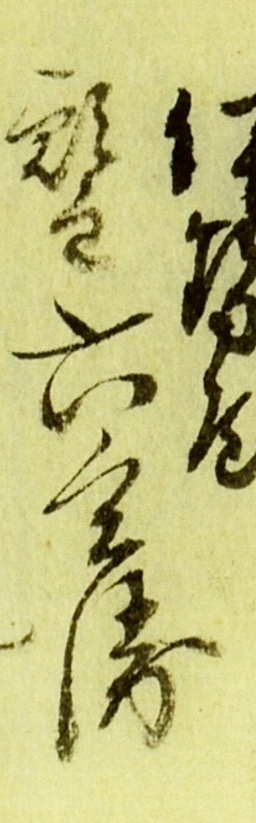願主六兵衛
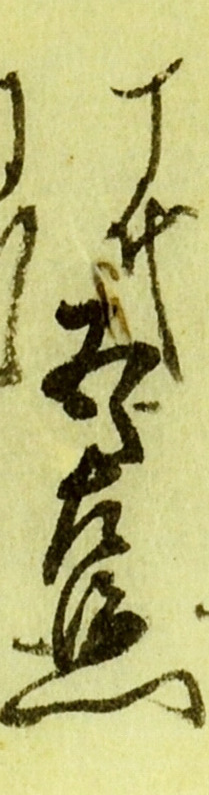丁代五郎左衛門
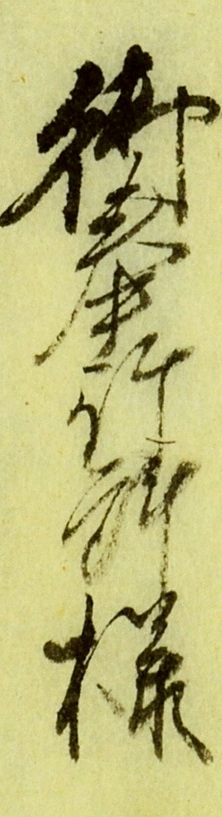御奉行所様

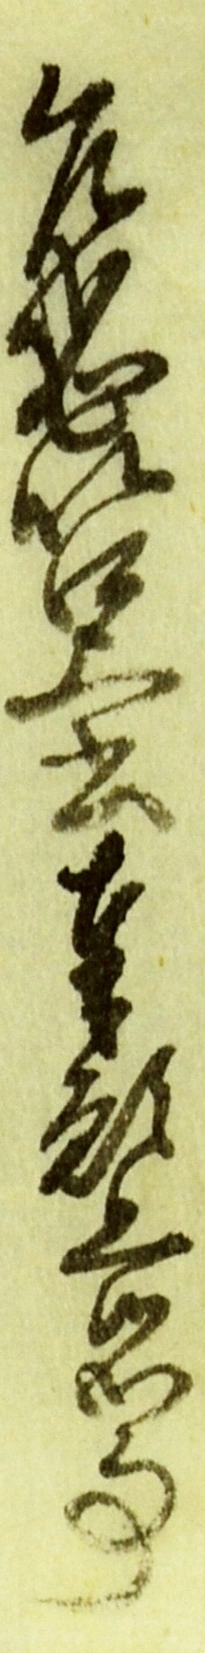乍恐以口上書奉願上候御事
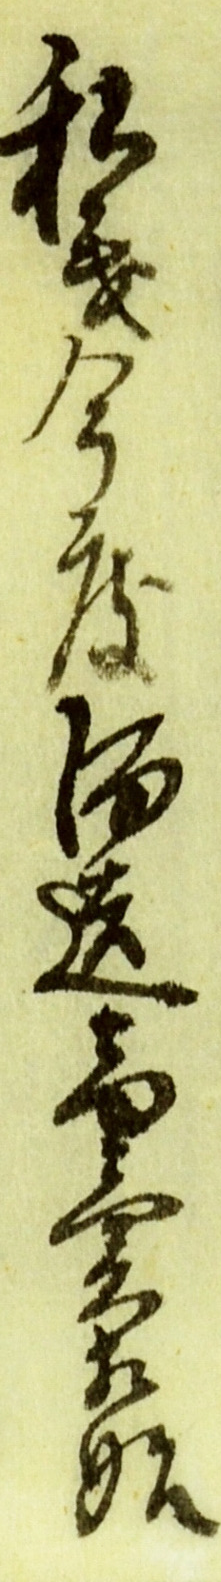私義今度酒造商売相始
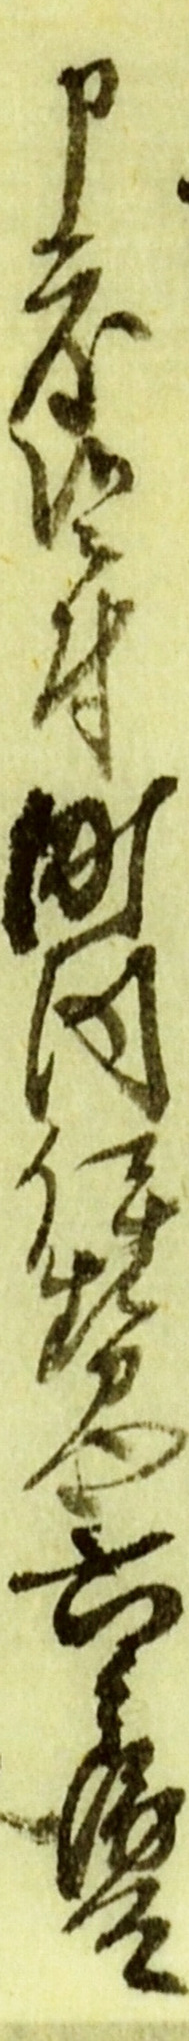申度候ニ付町内伊勢や六兵衛殿
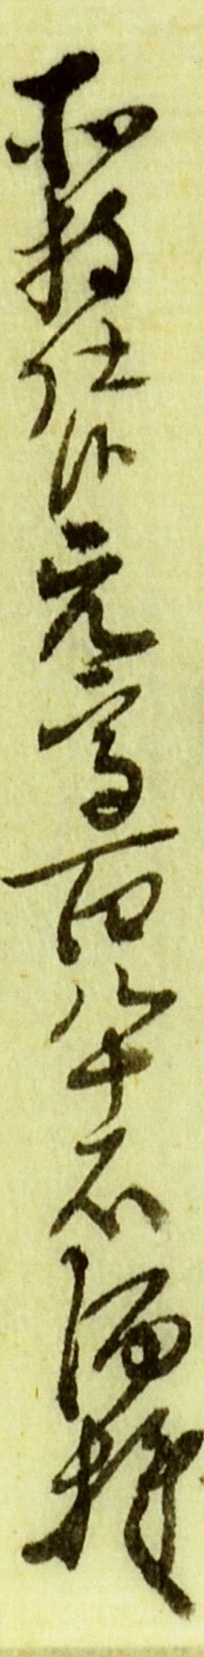所持仕候元高百八十石酒株
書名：造酒株一件始末
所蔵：伊那市立高遠町図書館・合同会社AMANE
